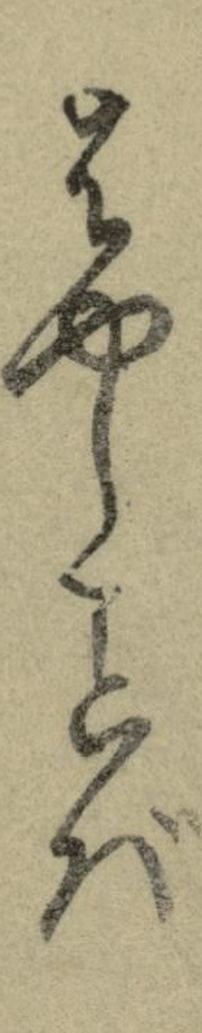はやしことば
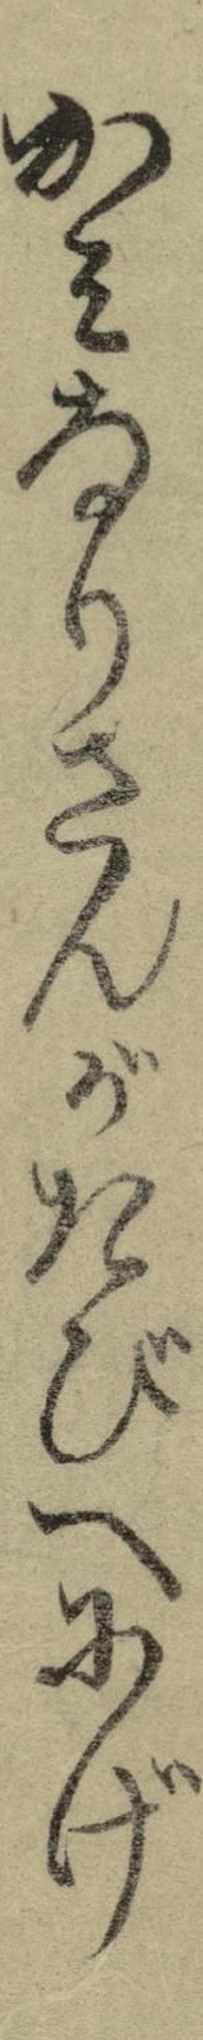かみなりさんがたびへにげ
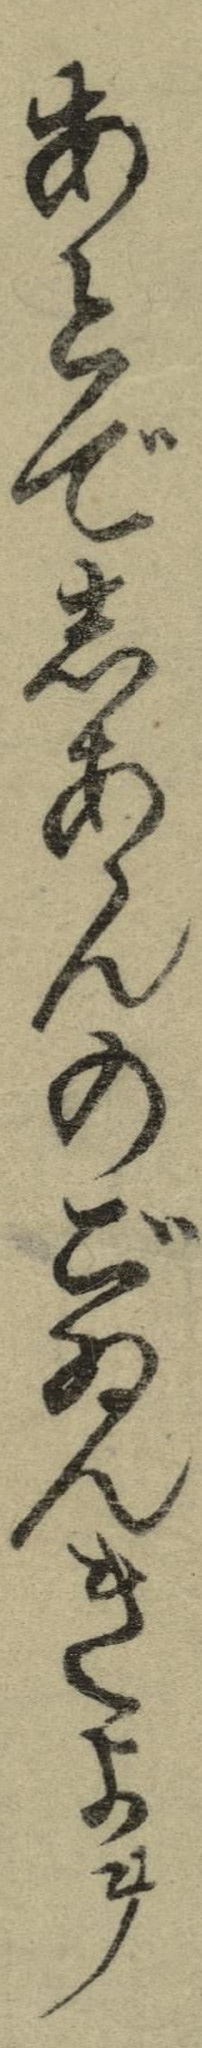あとでしあんのごゐんきよを
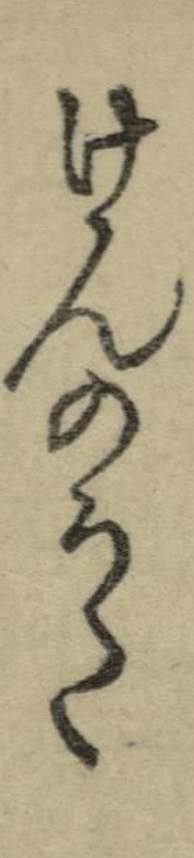けんのうた
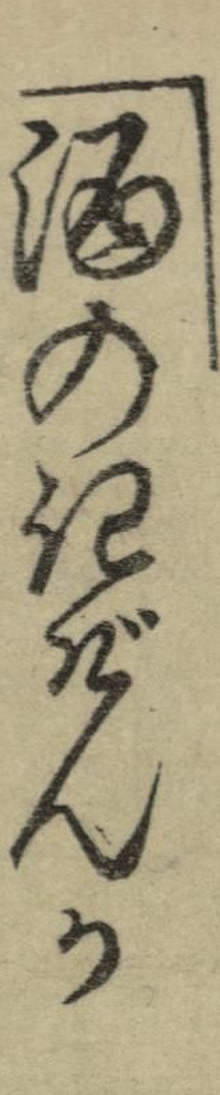〽酒のきげんか
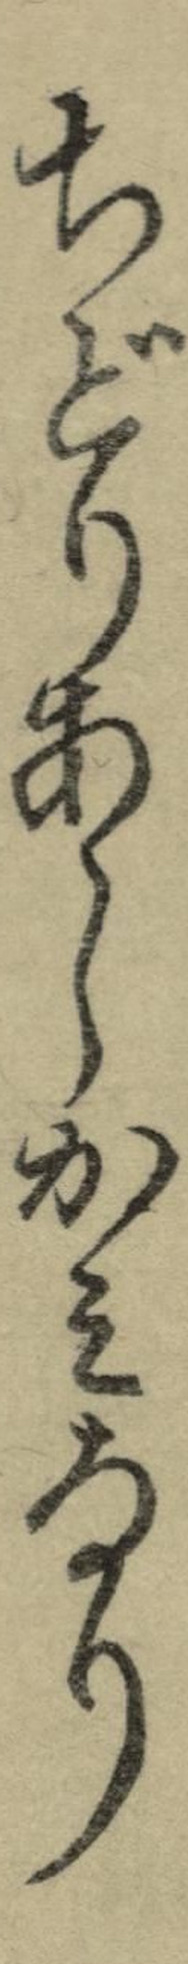ちどりあしかみなり
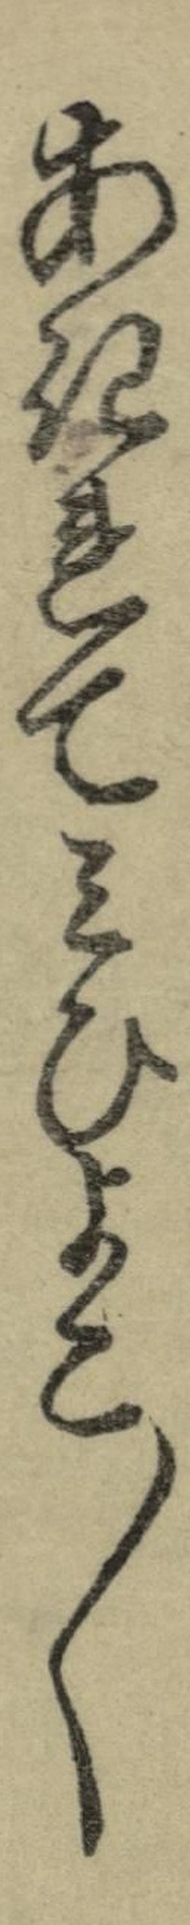あきれてみひよこ〳〵
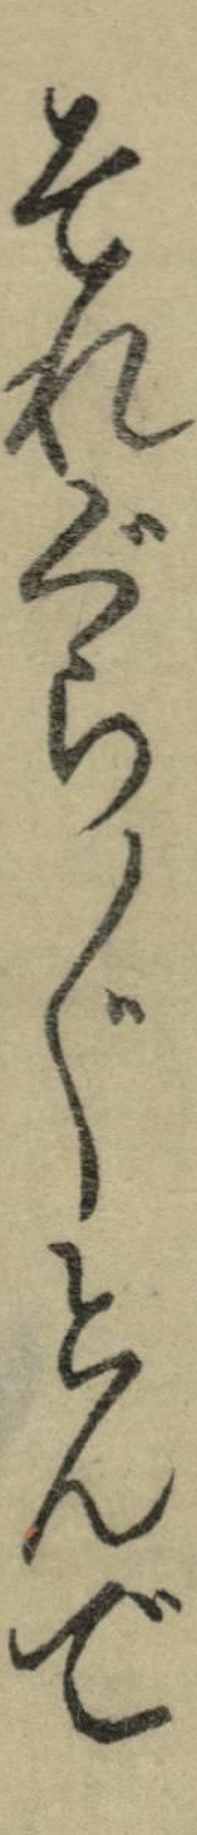それぐら〴〵とんで
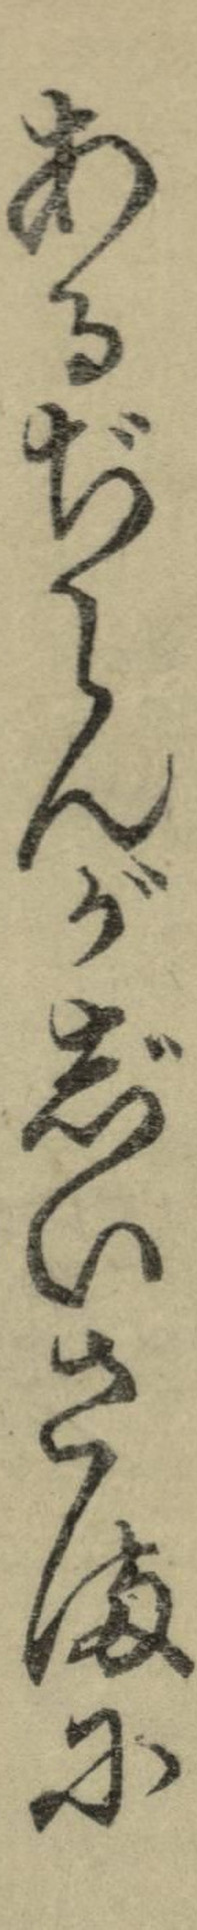あるぢしんがじいさまに
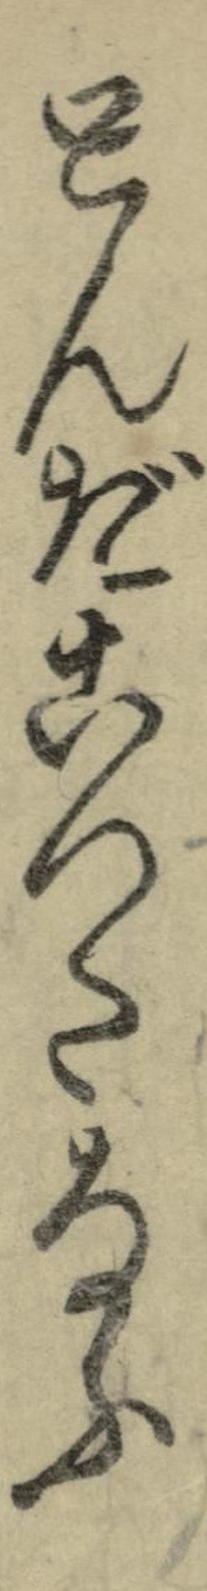とんだこつたなふ
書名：[けんのうた・はやしことバ]
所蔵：東京大学地震研究所図書室 Earthquake Research Institute Library, The University of Tokyo, JAPAN
